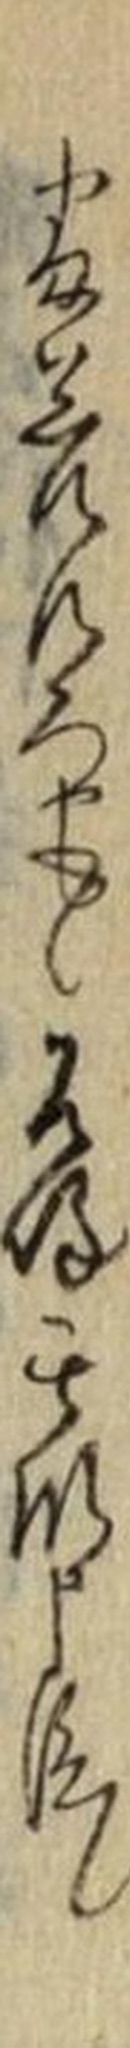番善左衛門宅へ召呼其段申渡候
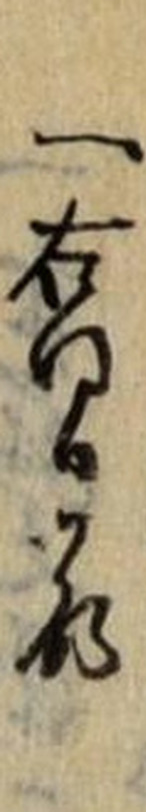一右同日御触
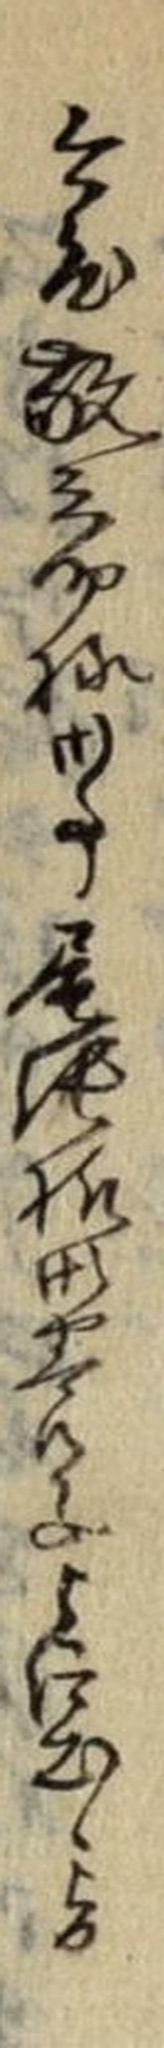今度敬之助様御事尾張様御養子被仰出候旨
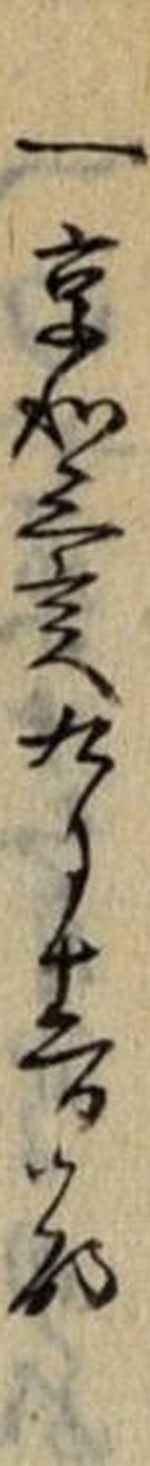一享和三亥九月十三日御触
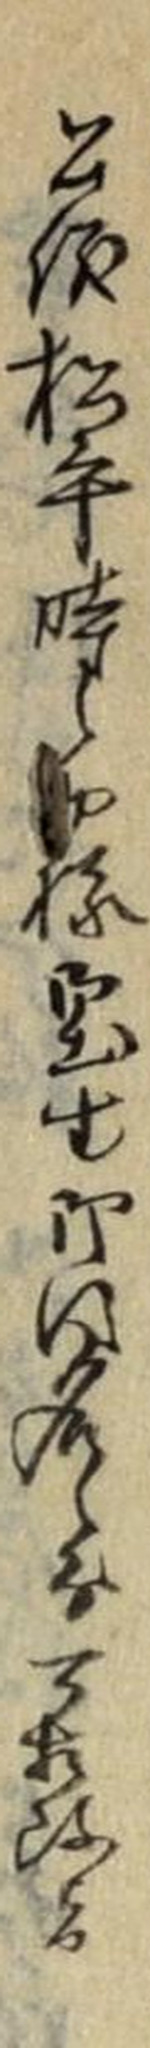公儀松平時之助様御出生御同名之分可相改旨
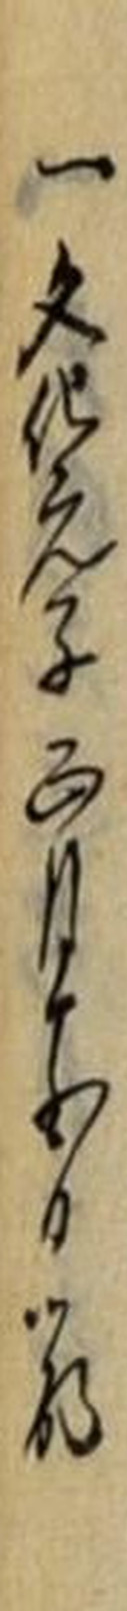一文化元子正月十五日御触
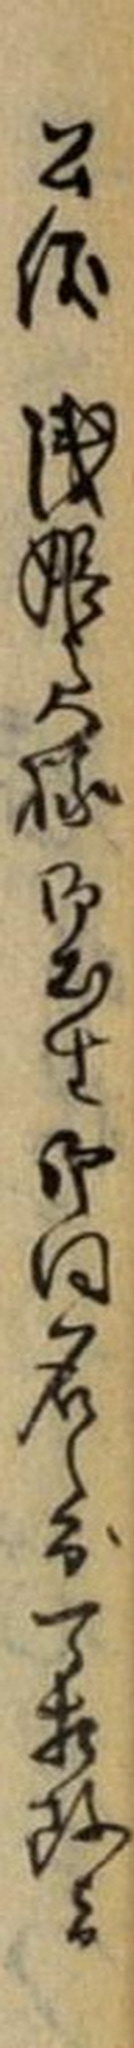公儀浅姫君様御出生御同名之分可相改旨
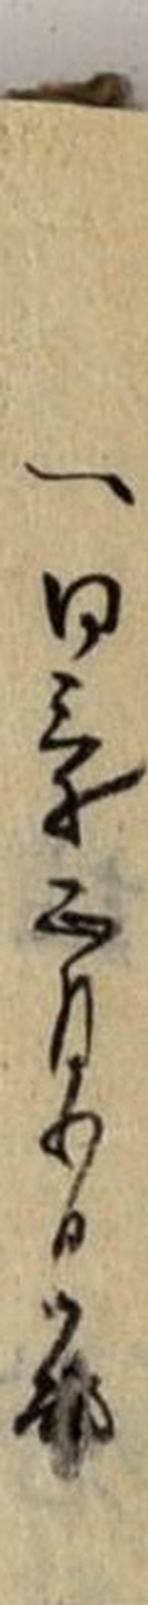一同三寅正月五日御触
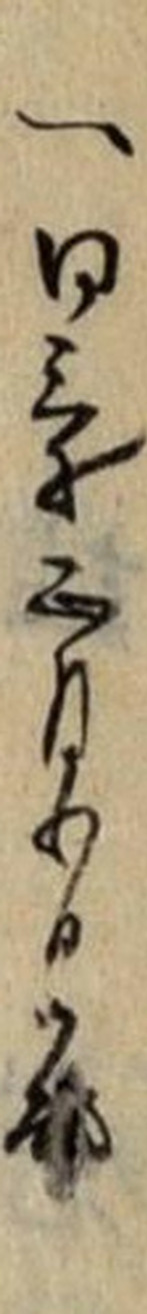一同三寅正月五日御触
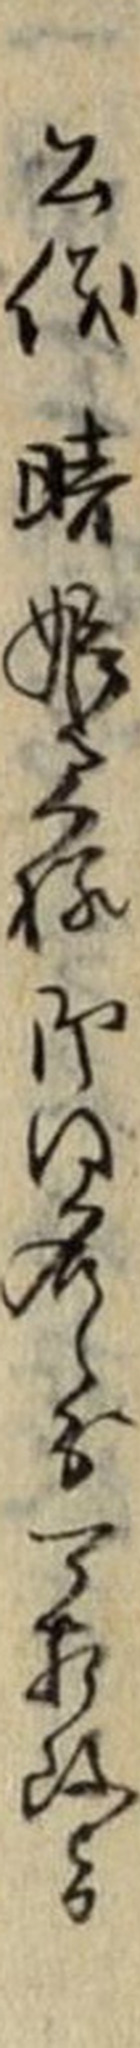公儀晴姫君様御同名之分可相改旨
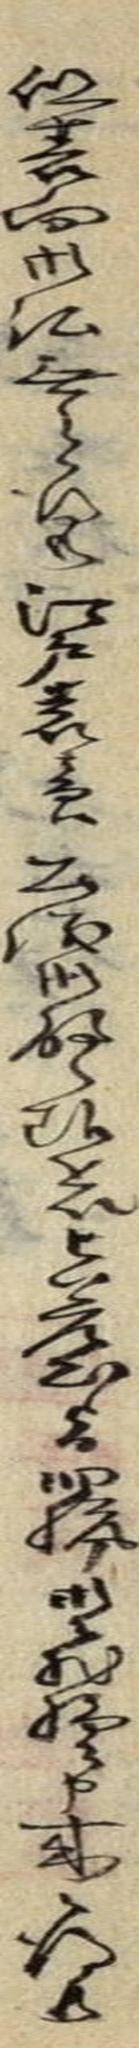但表向御弘無之候得共江戸表に而は公儀御触之趣を以被差出候旨旧臘御飛脚に而申来候得共
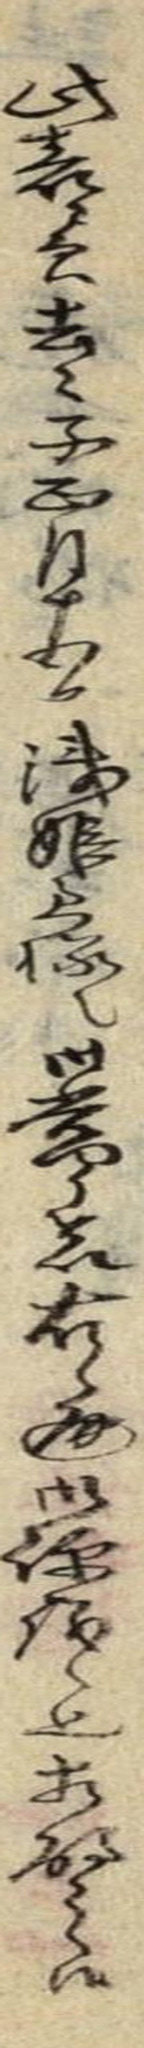此表に而は去々子正月十五日浅姫君様之御当りを以右之通御評議之上相触之候
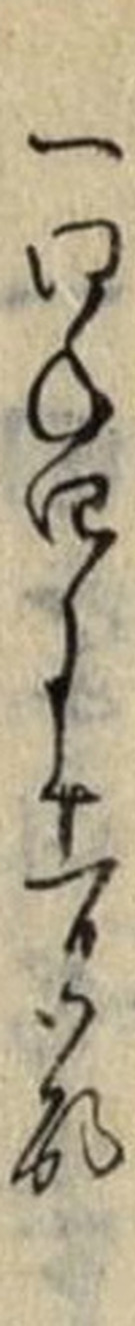一同年四月十一日御触
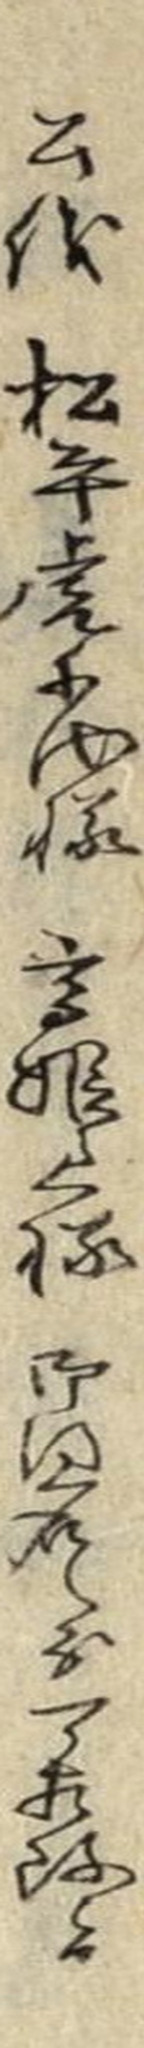公儀松平虎千代様高姫君様御同名之分可相改旨
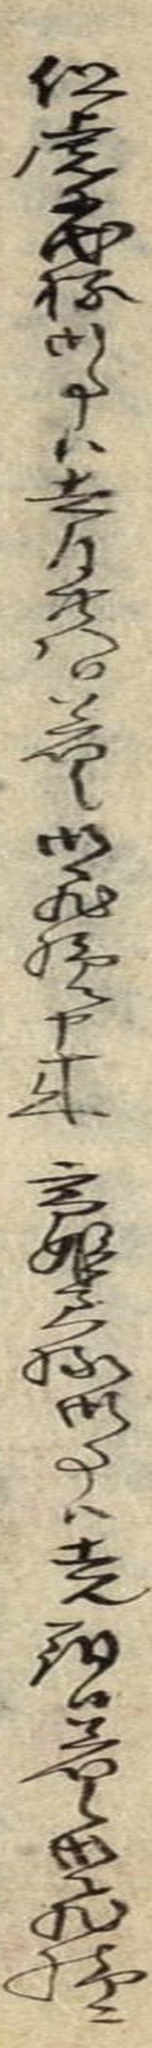但虎千代様御事は去月廿八日着之御飛脚に申来高姫君様御事は去ル朔日着之御飛脚に
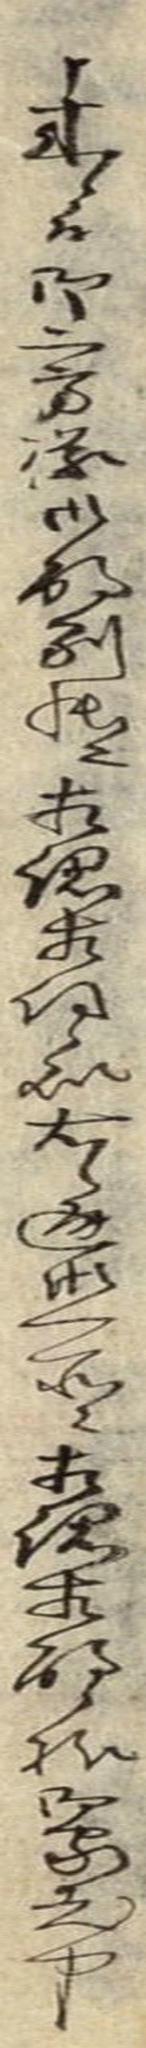申来候に付御二方儀御触別紙に相認相伺候処右之通御一所に相認相触候様御家老中
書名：蒐輯之部
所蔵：福井県文書館 Fukui Prefectural Archives
